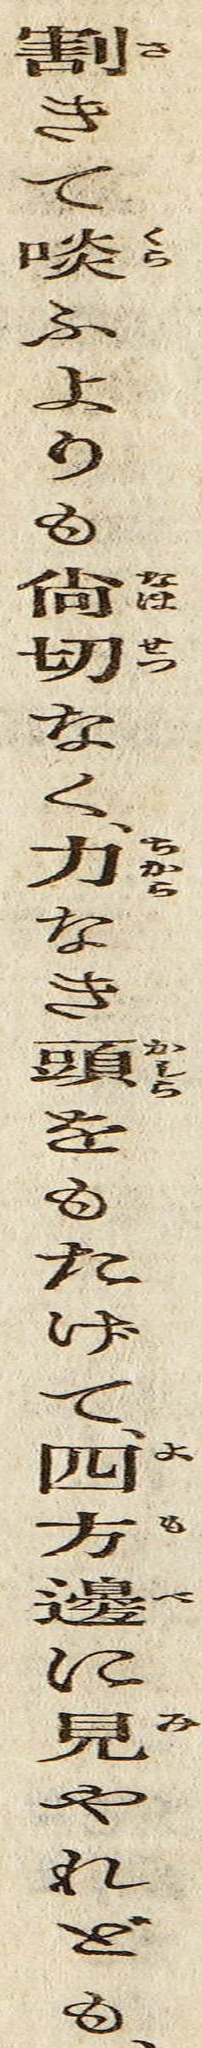割きて啖ふよりも尚切なく、力なき頭をもたげて、四方辺に見やれども、
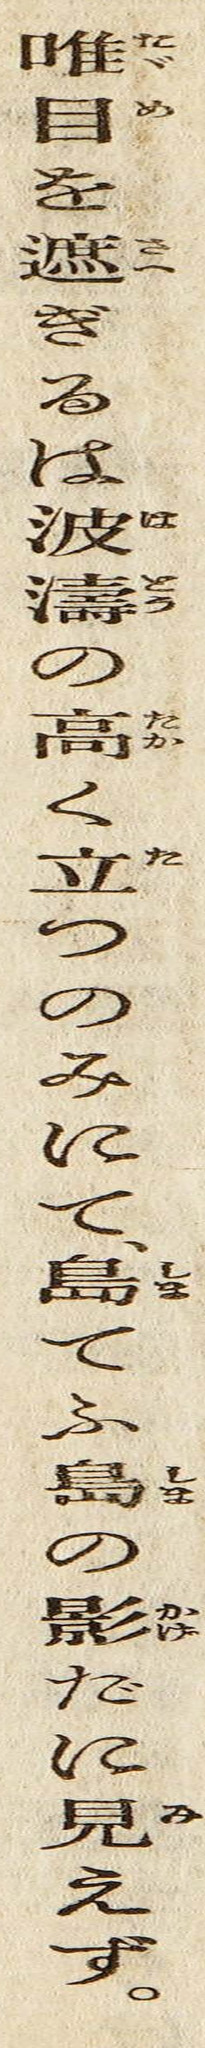唯目を遮ぎるは波濤の高く立つのみにて、島てふ島の影だに見えず。
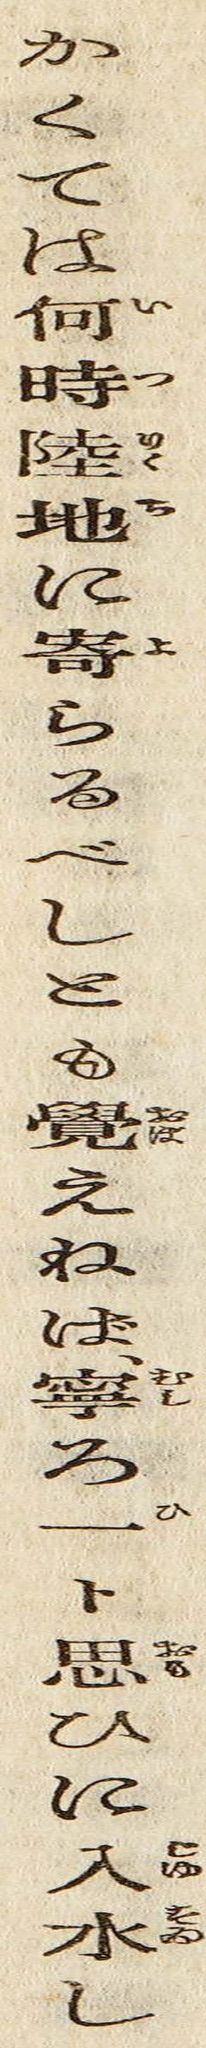かくては何時陸地に寄らるべしとも覚えねば、寧ろ一ト思ひに入水し
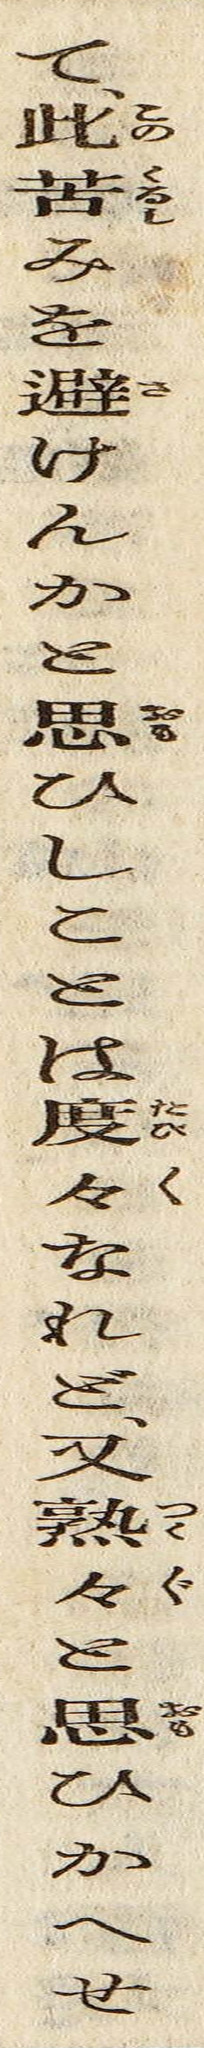て、此苦みを避けんかと思ひしことは度々なれど、又熟々と思ひかへせ
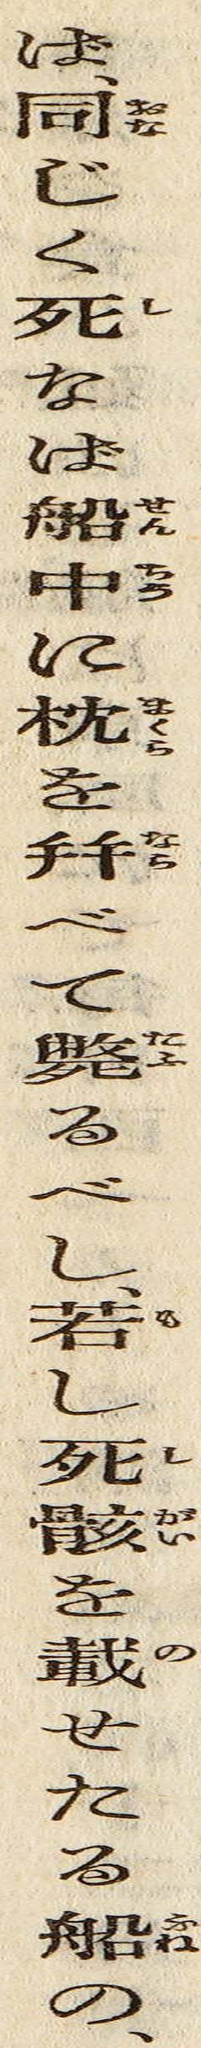ば、同じく死なば船中に枕を并べて斃るべし、若し死骸を載せたる船の、
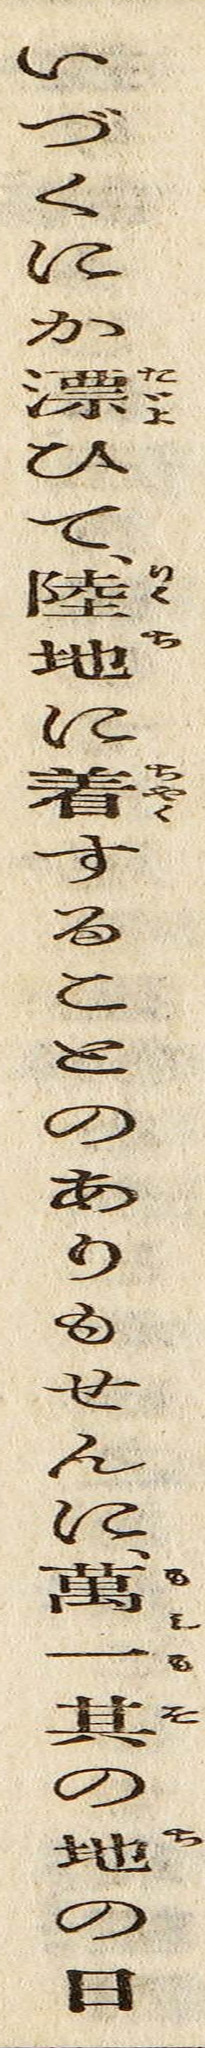いづくにか漂ひて、陸地に着することのありもせんに、万一其の地の日
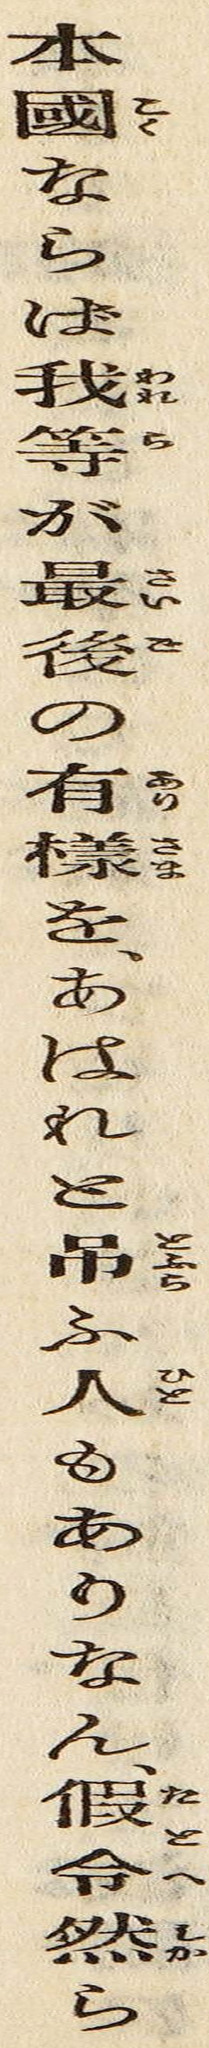本国ならば我等が最後の有様を、あはれと吊ふ人もありなん、仮令然ら
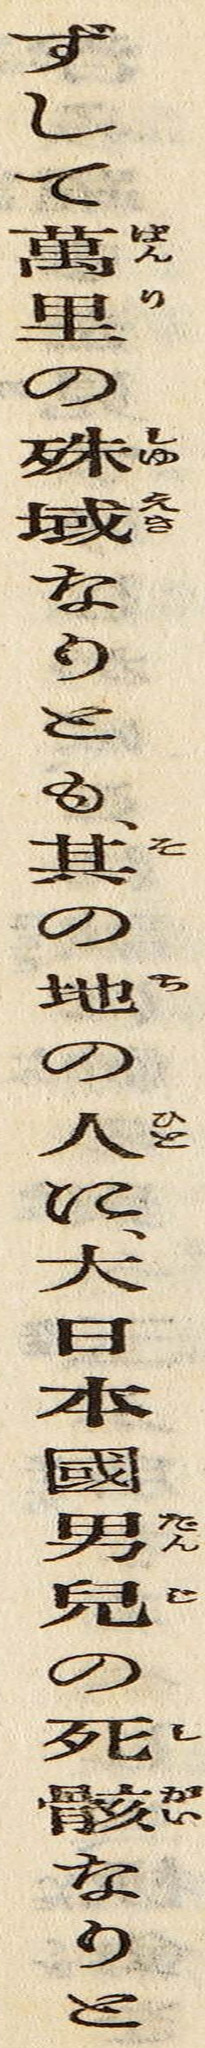ずして万里の殊域なりとも、其の地の人に、大日本国男児の死骸なりと
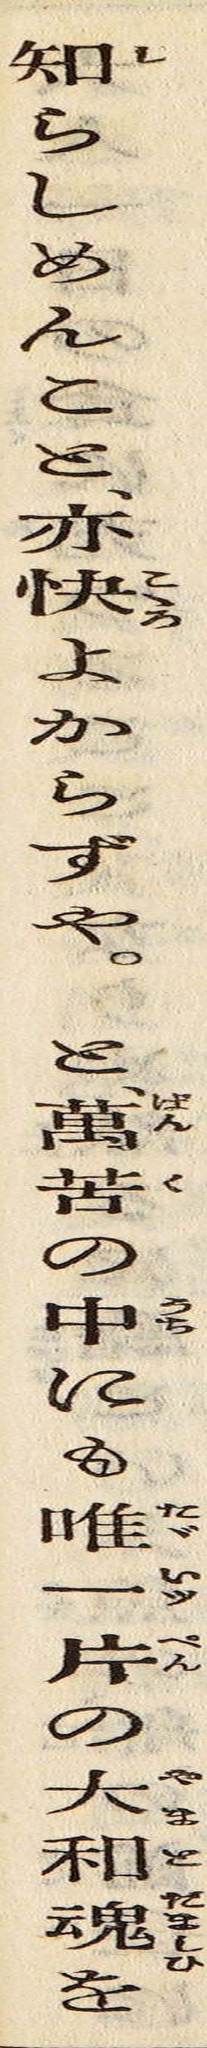知らしめんこと、亦快よからずや。と、万苦の中にも唯一片の大和魂を
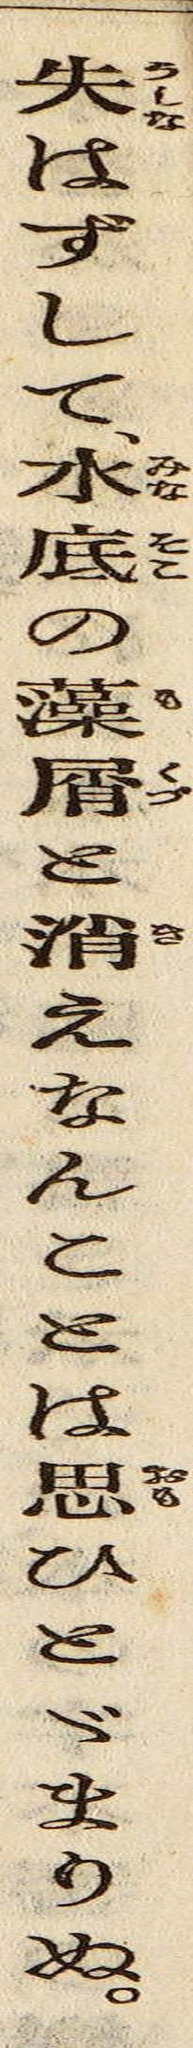失はずして、水底の藻屑と消えなんことは思ひとゞまりぬ。
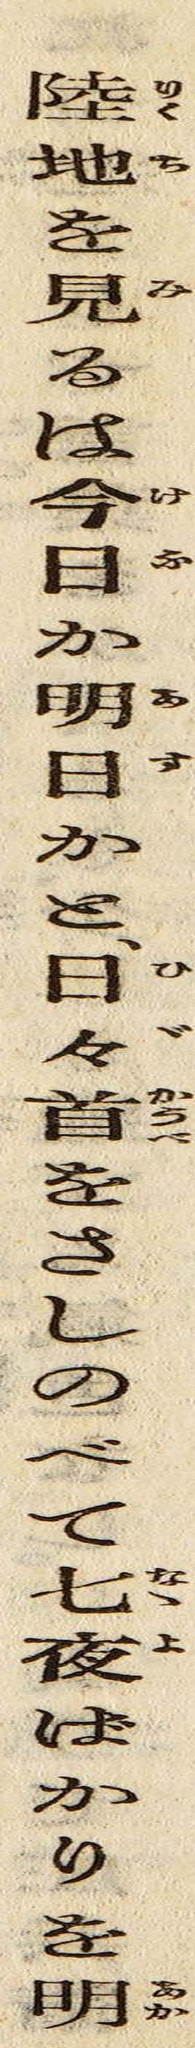陸地を見るは今日か明日かと、日々首をさしのべて七夜ばかりを明
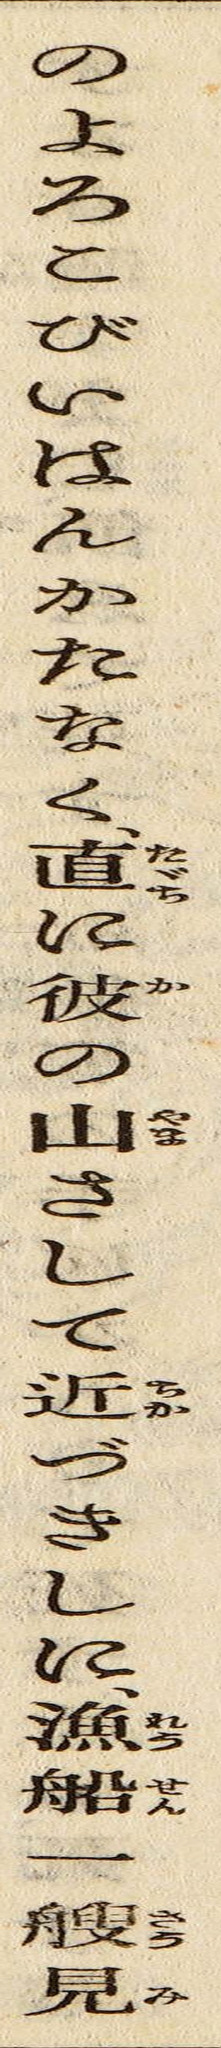のよろこびいはんかたなく、直に彼の山さして近づきしに、漁船一艘見
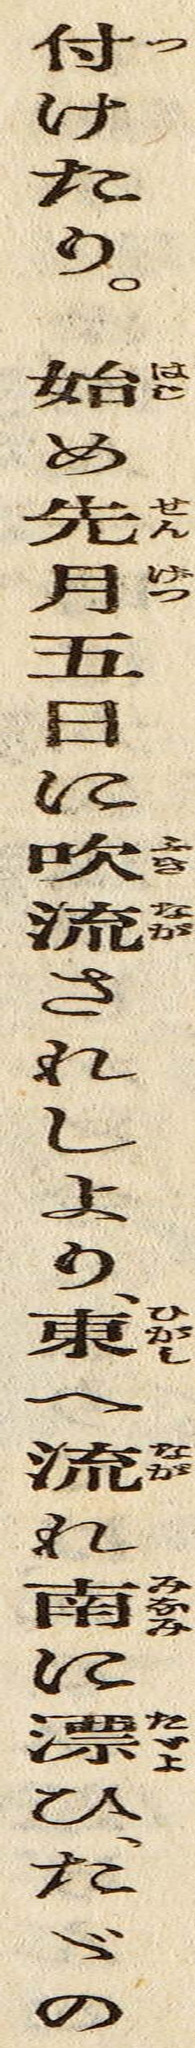付けたり。始め先月五日に吹流されしより、東へ流れ南に漂ひ、たゞの
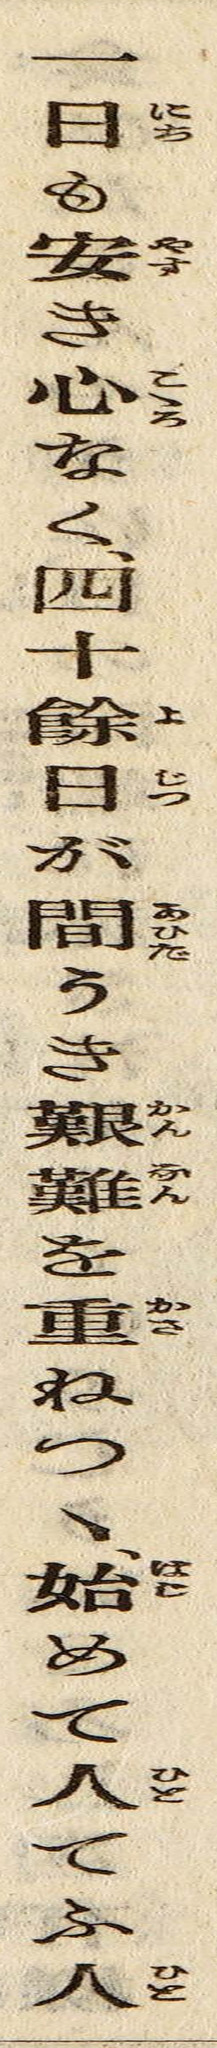一日も安き心なく、四十余日が間うき艱難を重ねつヽ、始めて人てふ人
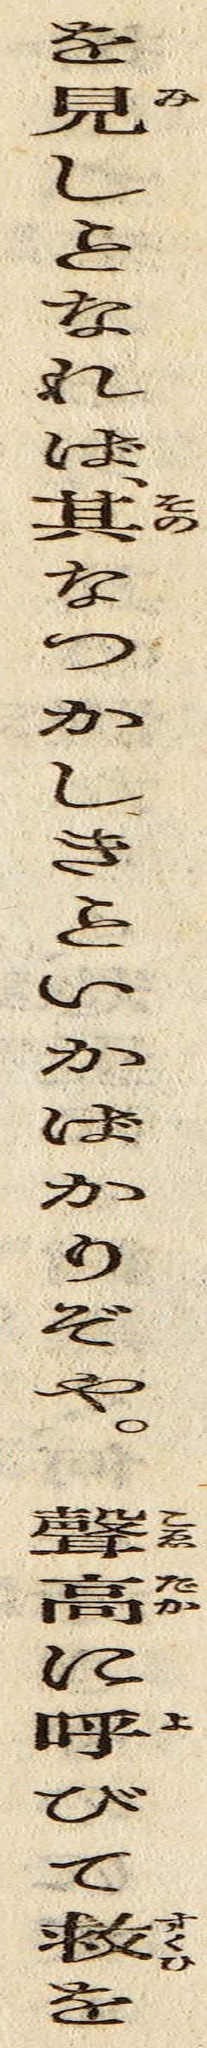を見しことなれば、其なつかしきこといかばかりぞや。声高に呼びて救を
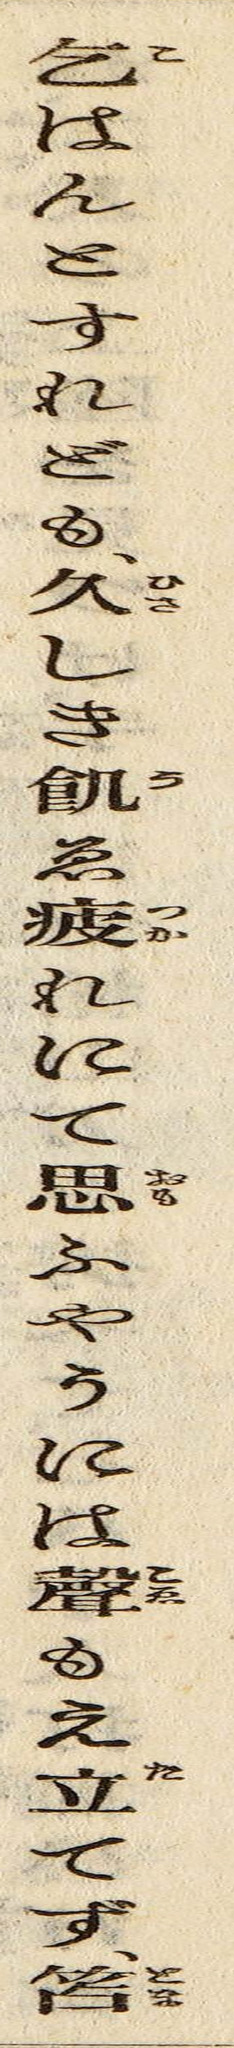乞はんとすれども、久しき飢ゑ疲れにて思ふやうには声もえ立てず、笘
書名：日本漂流譚
